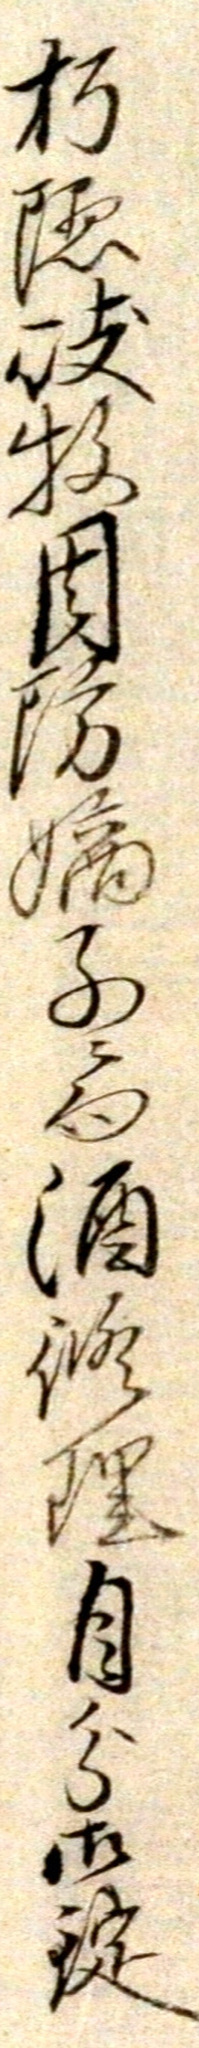朽隠岐牧周防嫡子ニ而酒修理自分御錠
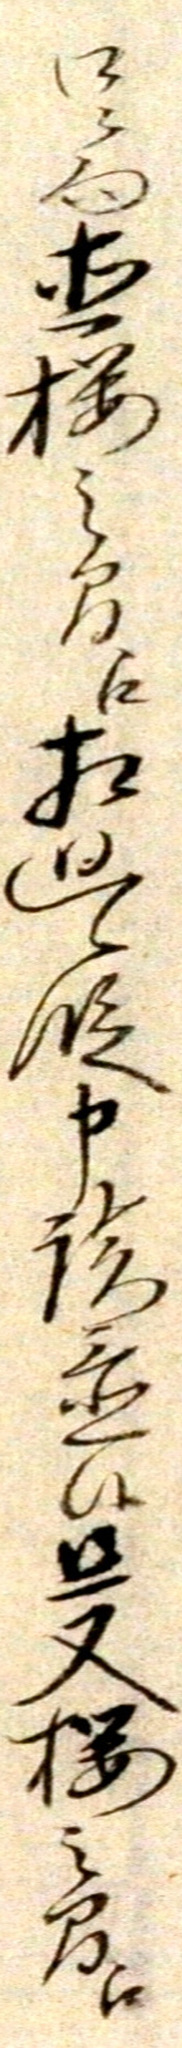口ニ而直桜之間え相廻候段申談置候且又桜之間え
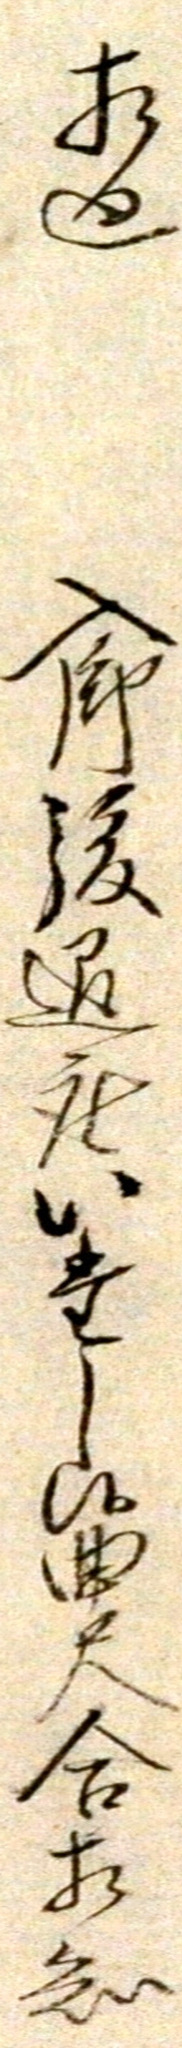相廻入御後退座いたし候曲尺合相知
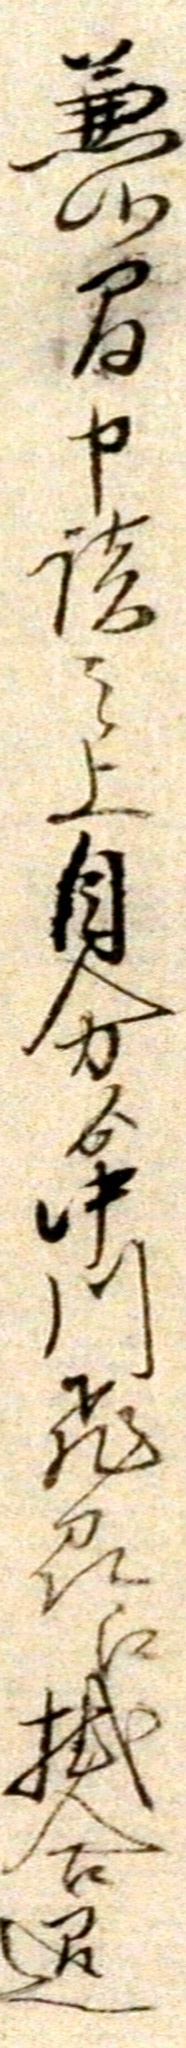兼候間申談之上自分ゟ中川飛州え掛合退
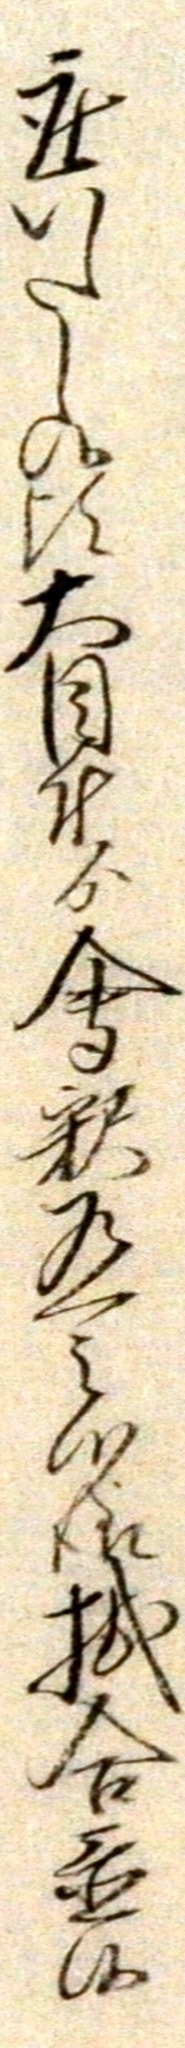座いたし候頃大目付ゟ会釈有之候様掛合置候

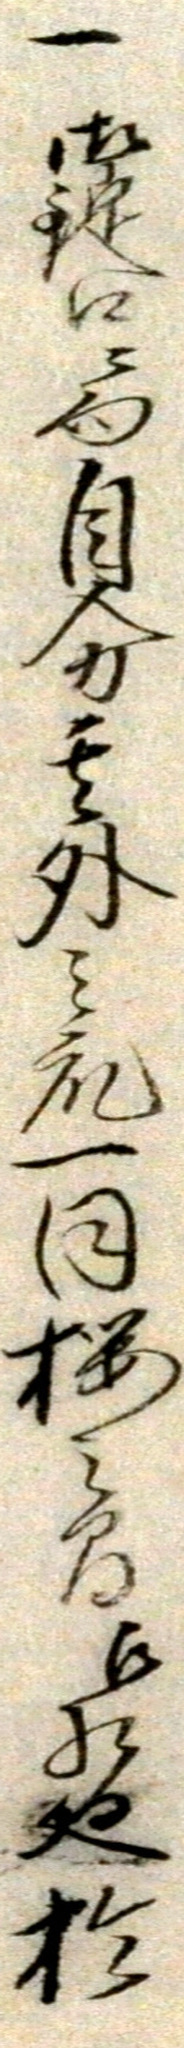一御錠口ニ而自分其外之衆一同桜之間え相廻於
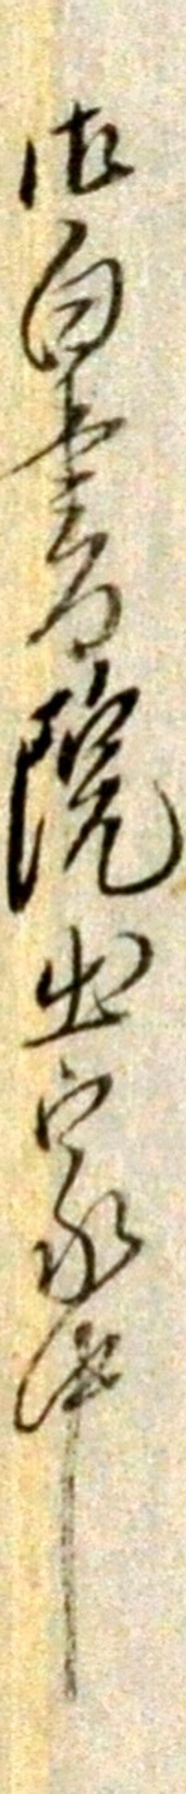御白書院出家中
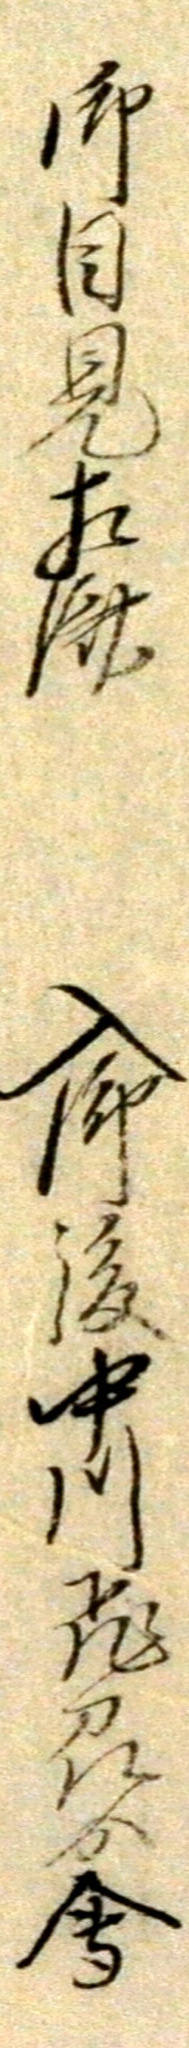御目見相済入御後中川飛州ゟ会
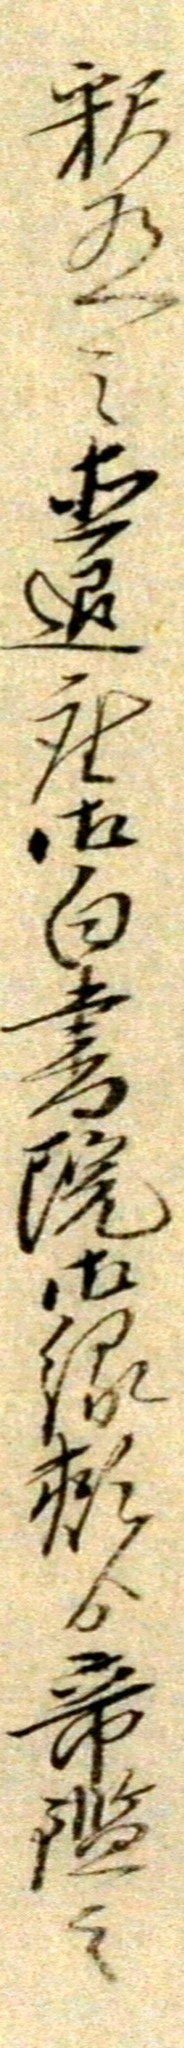釈有之直退座御白書院御縁頬ゟ帝鑑之
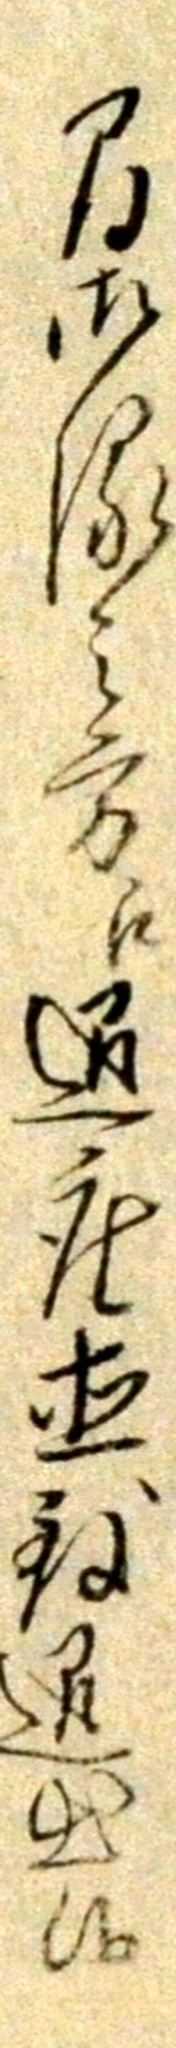間御縁之方え退座直致候退出候
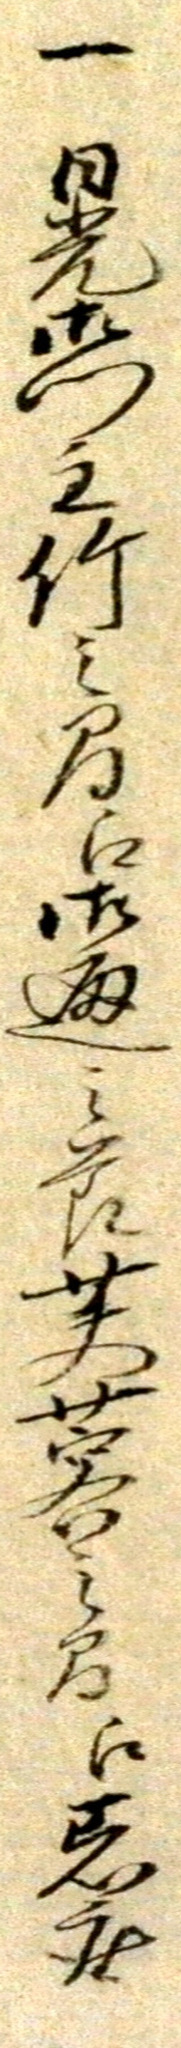一日光御門主竹之間え御通之節芙蓉之間え着座
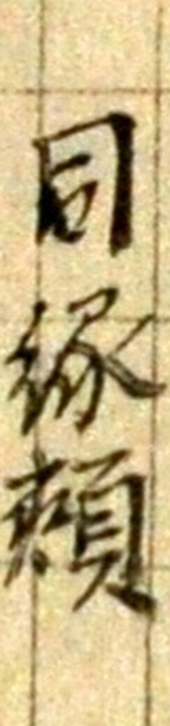同縁頬
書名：御座ノ間御修覆中日光御門主御対顔ノ節ノ留
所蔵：伊那市立高遠町図書館・合同会社AMANE
